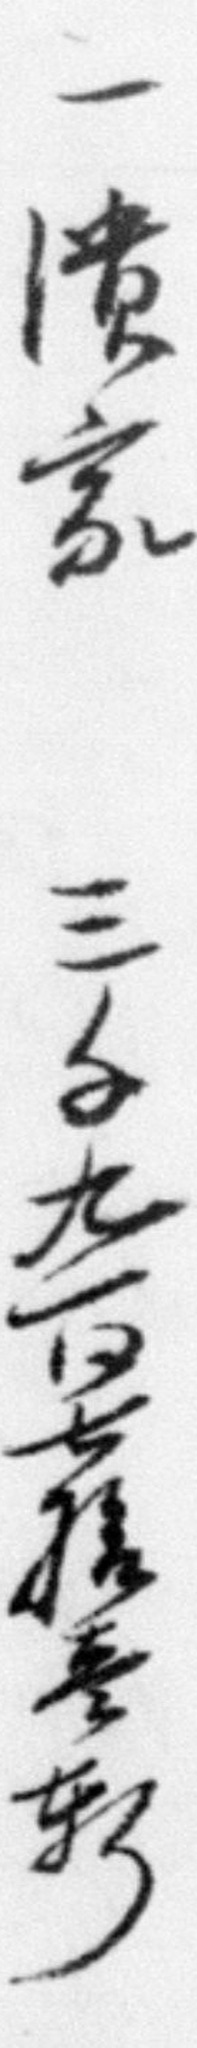一潰家三千九百七拾壱軒
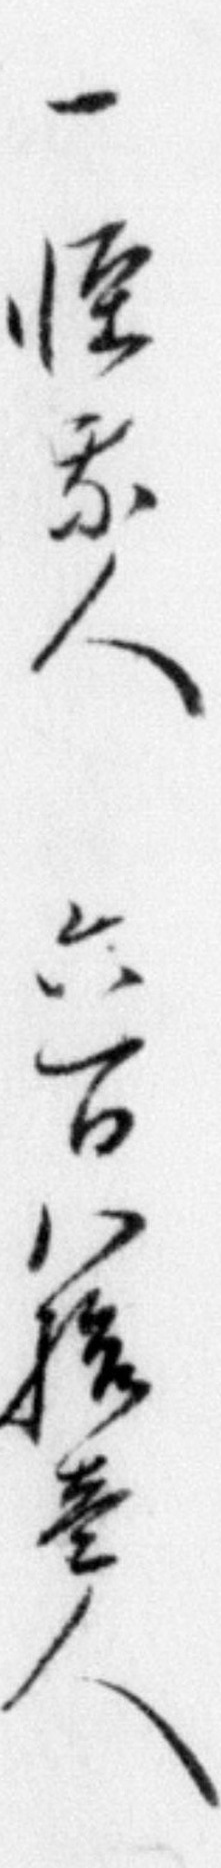一怪我人六百八拾壱人
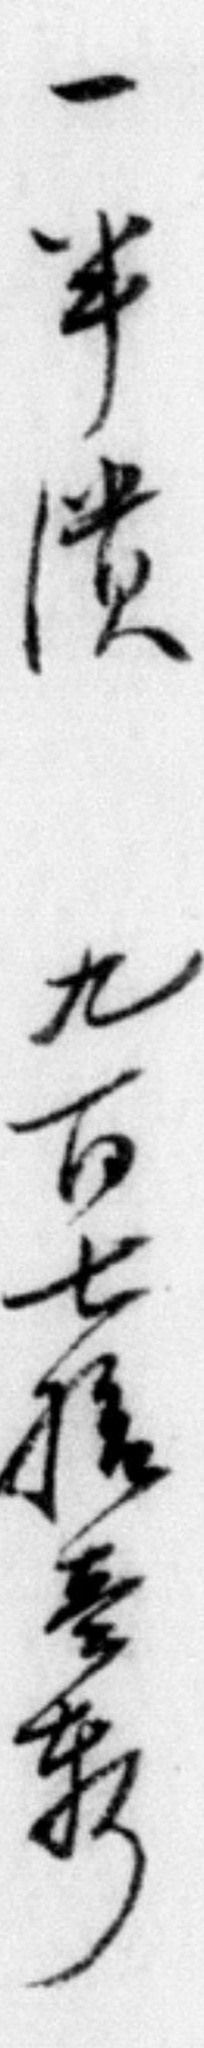一半潰九百七拾壱軒
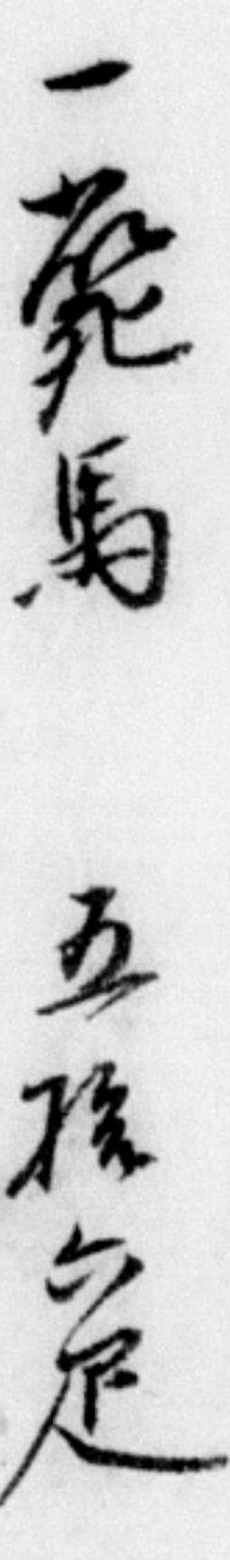一斃馬五拾六疋
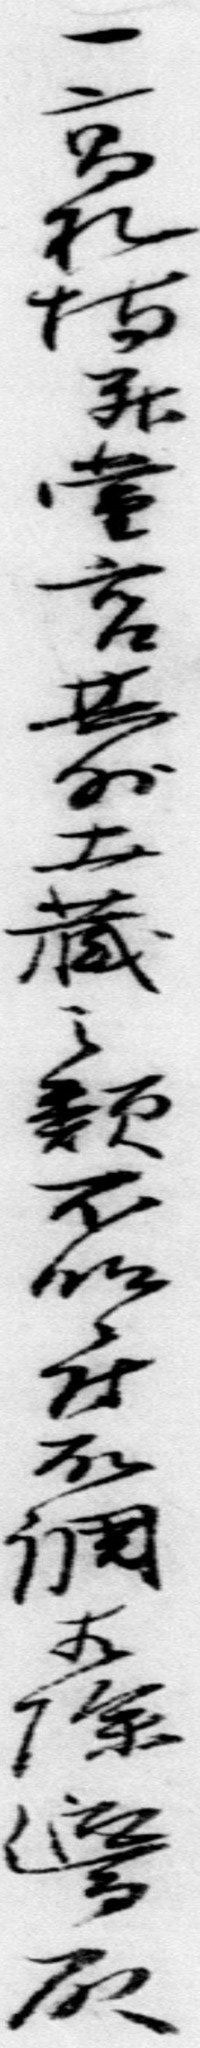一高札場幷堂宮其外土蔵之類不明に付取調相除追而取

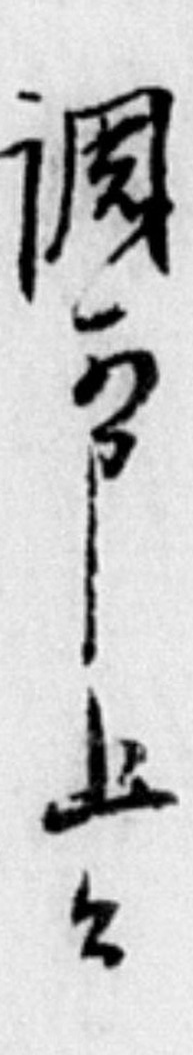調可申上候
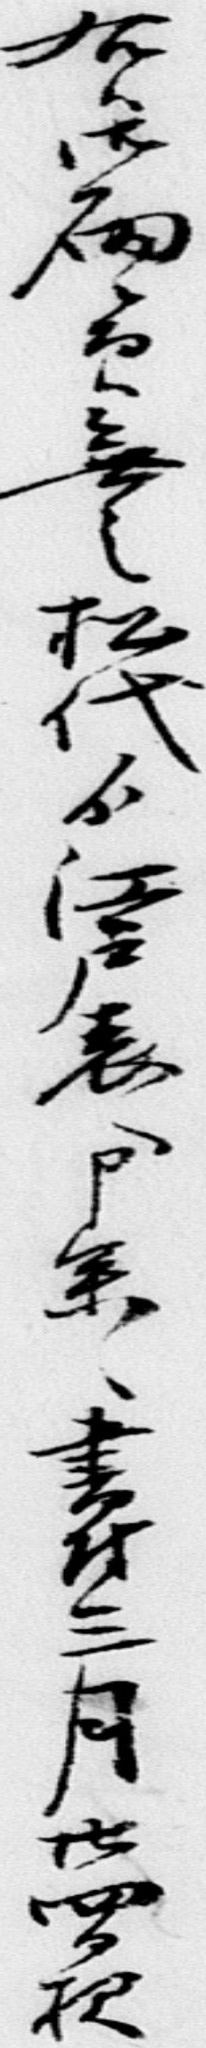右は御届に而無之松代ゟ江戸表へ申参候書付三月廿四日夜
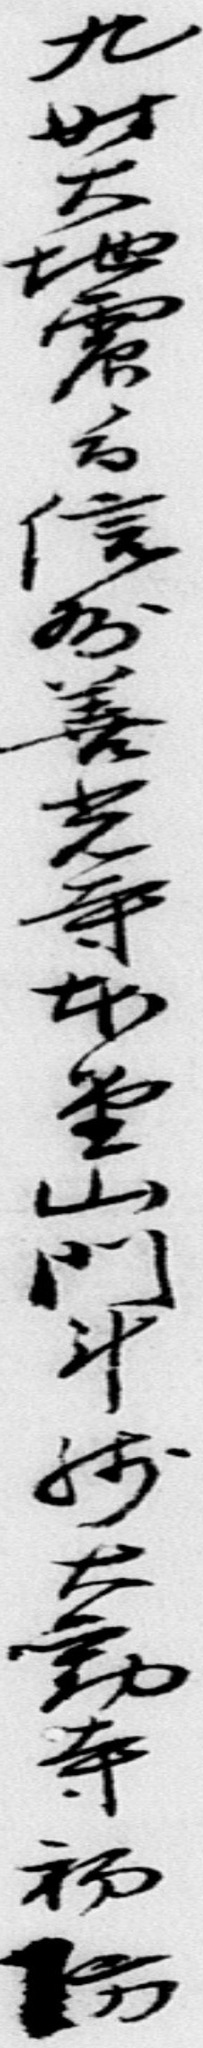九時大地震に而信州善光寺本堂山門計残大勧寺初坊
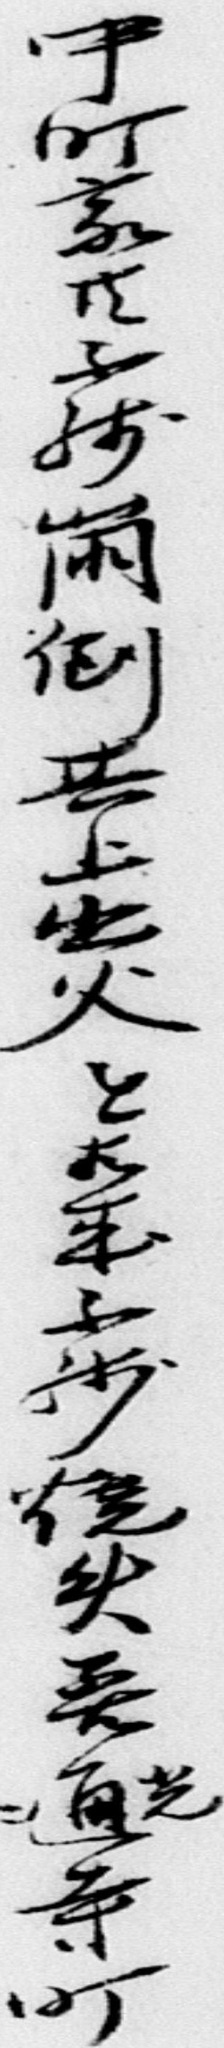中町家共不残崩倒其上出火と相成不残焼失善光寺町
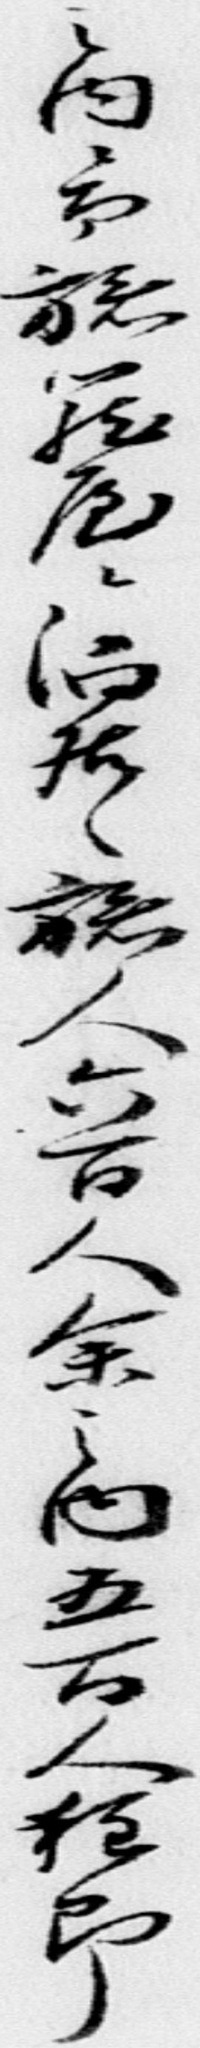之内に而旅籠屋に泊居候旅人六百人余之内五百人程即
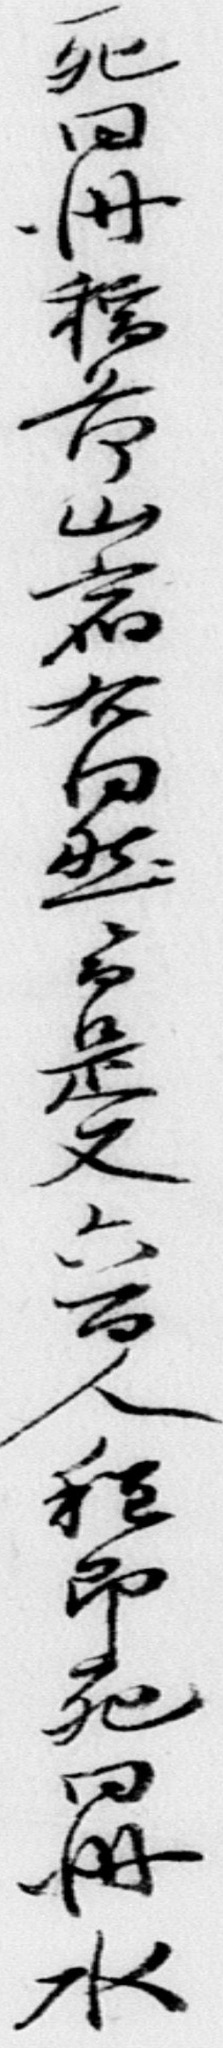死同州稲荷山宿右同然に而是又六百人程即死同州水
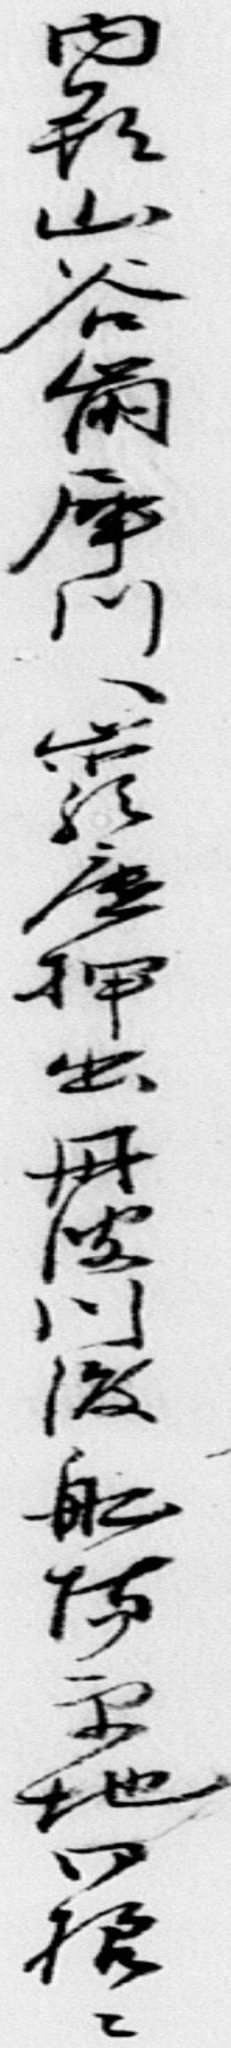内郡山谷崩犀川へ巌底押出丹波川渡船場平地同様に
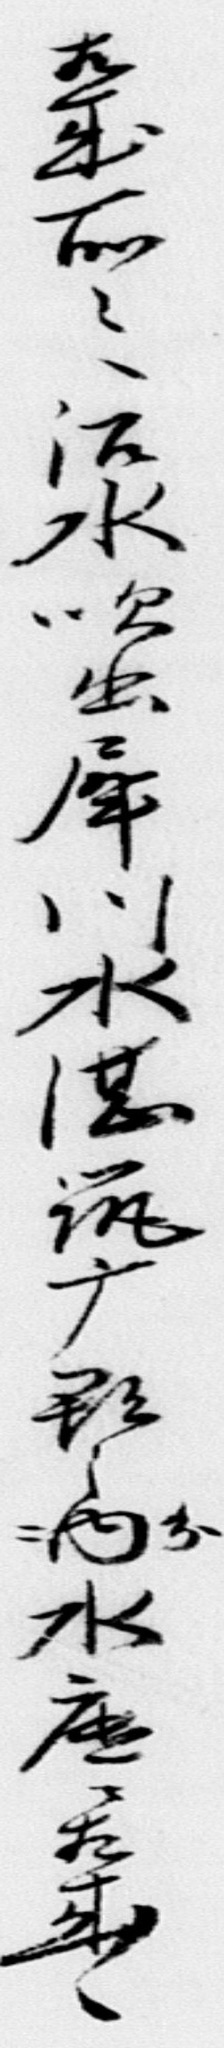相成所々へ泥水吹出犀川水湛筑摩郡之分水底に相成候
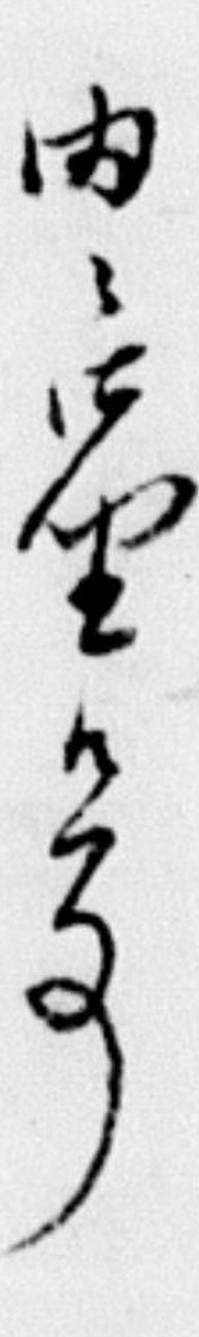由に御座候事
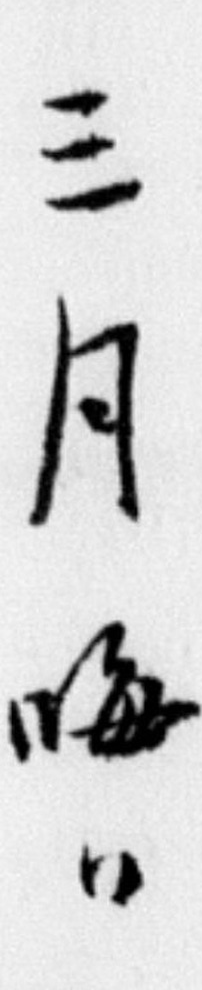三月晦日
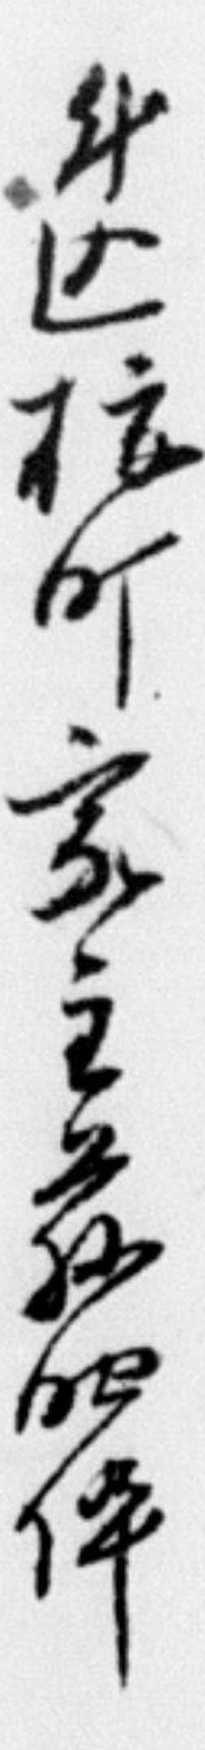牛込榎町家主藤助忰
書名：信州大地震一件
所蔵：徳島県立図書館
